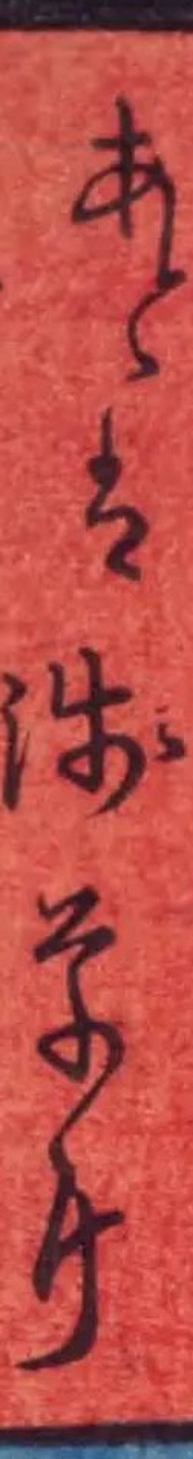あとは浅草に
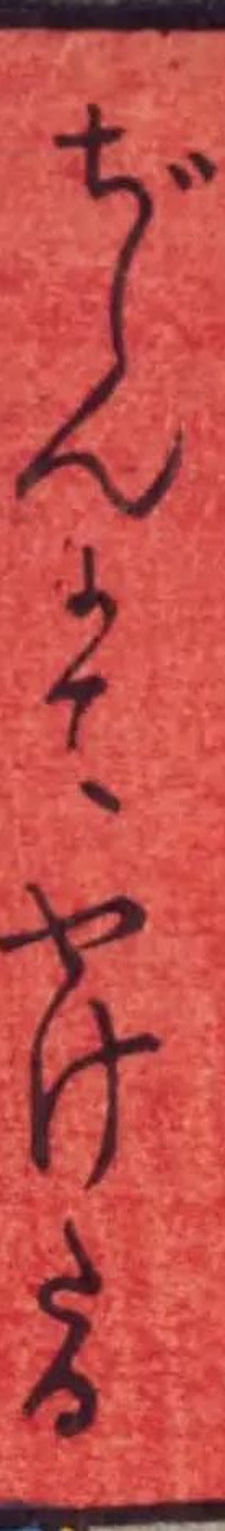ぢしんにてやけたる
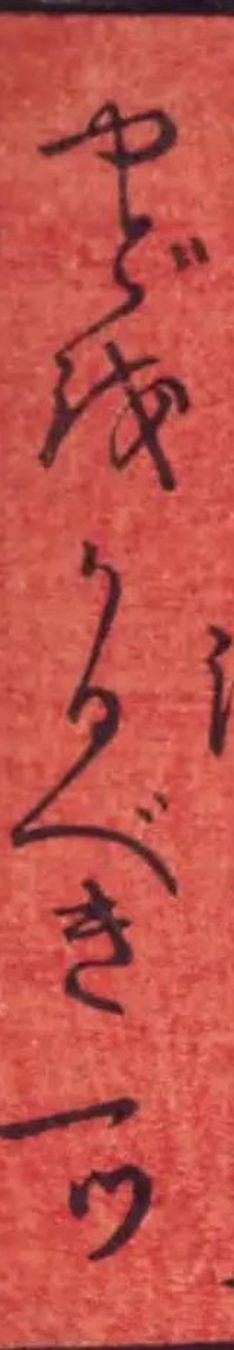やどをかるべき一ッ
